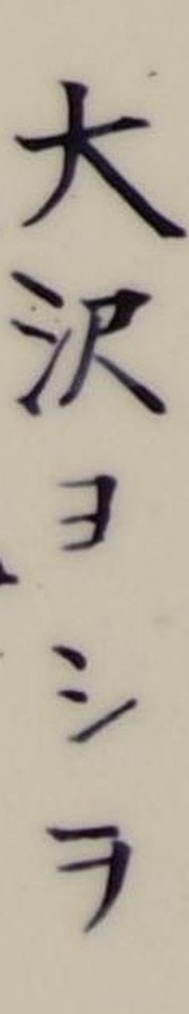大沢ヨシヲ
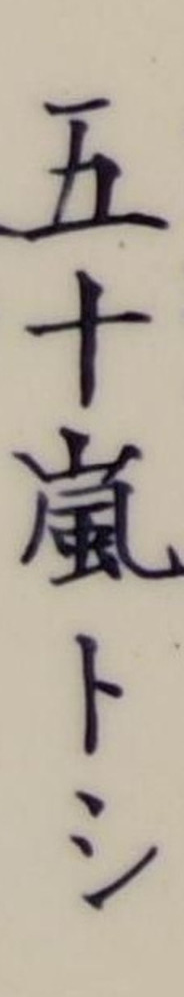五十嵐トシ
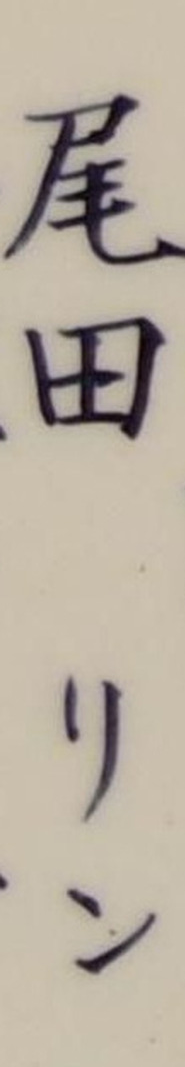尾田リン
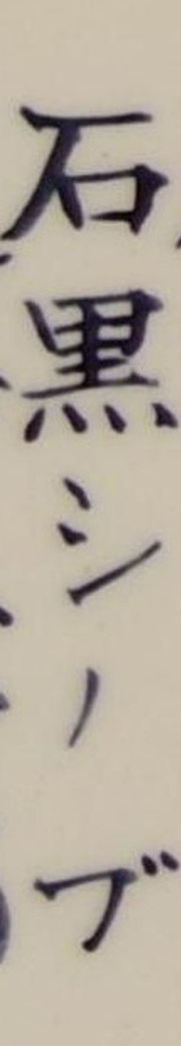石黒シノブ
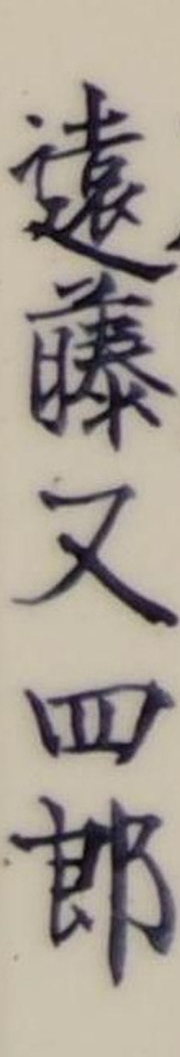遠藤又四郎

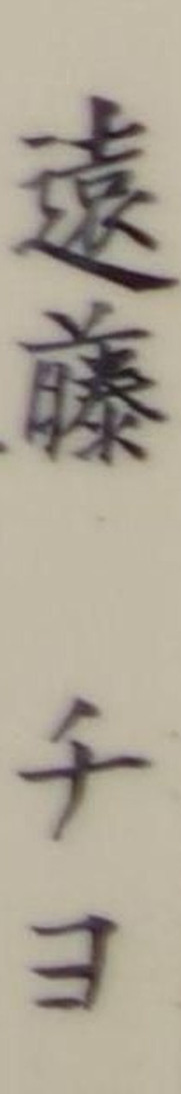遠藤チヨ
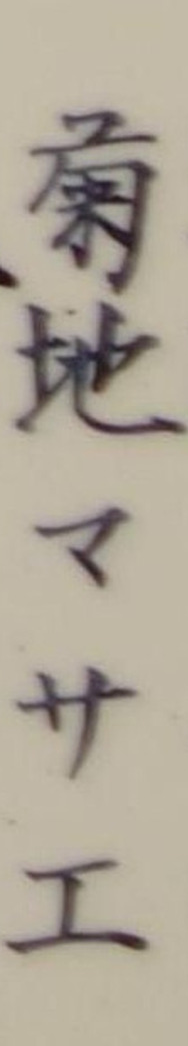菊地マサエ
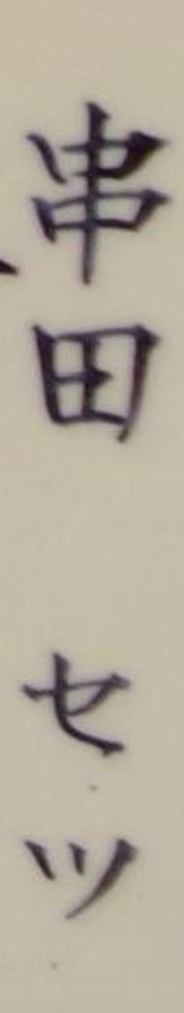串田セツ
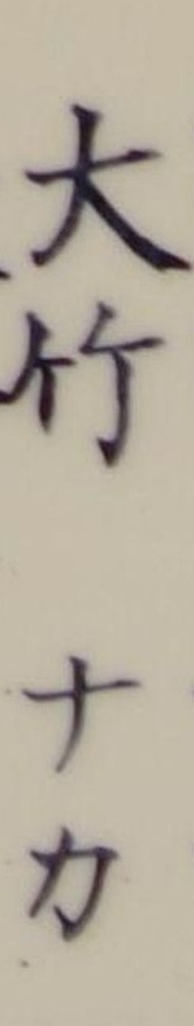大竹ナカ
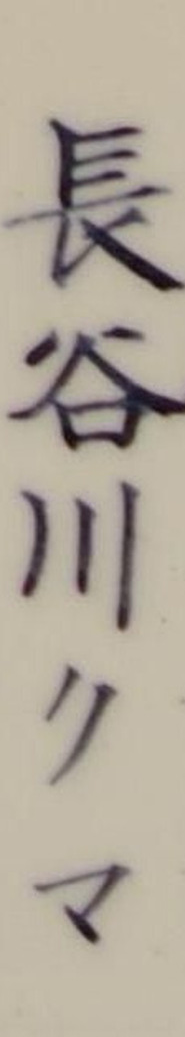長谷川クマ
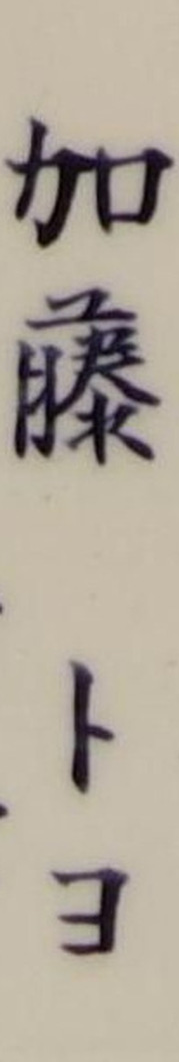加藤トヨ
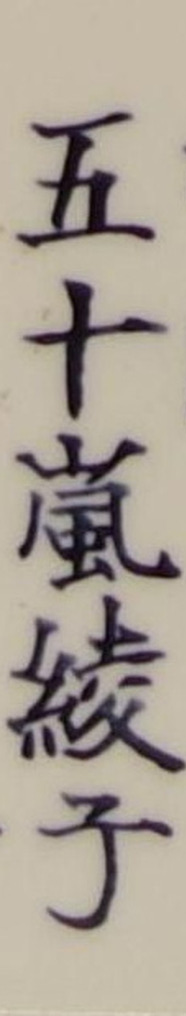五十嵐綾子
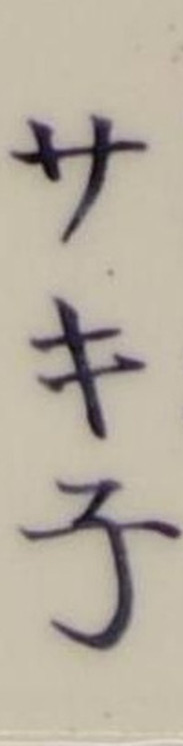サキ子
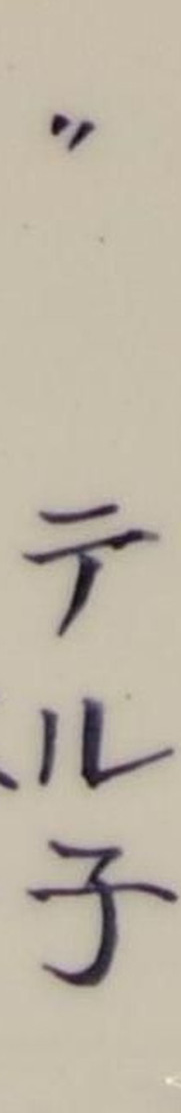テル子
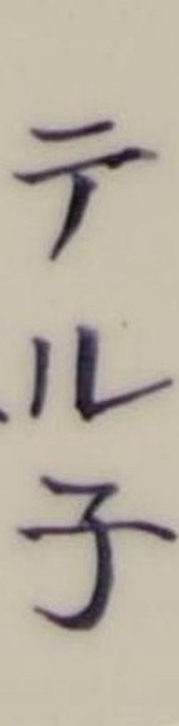テル子
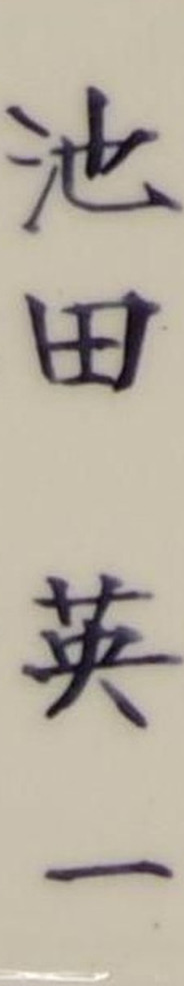池田英一
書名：M~S
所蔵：高野山金剛峯寺
